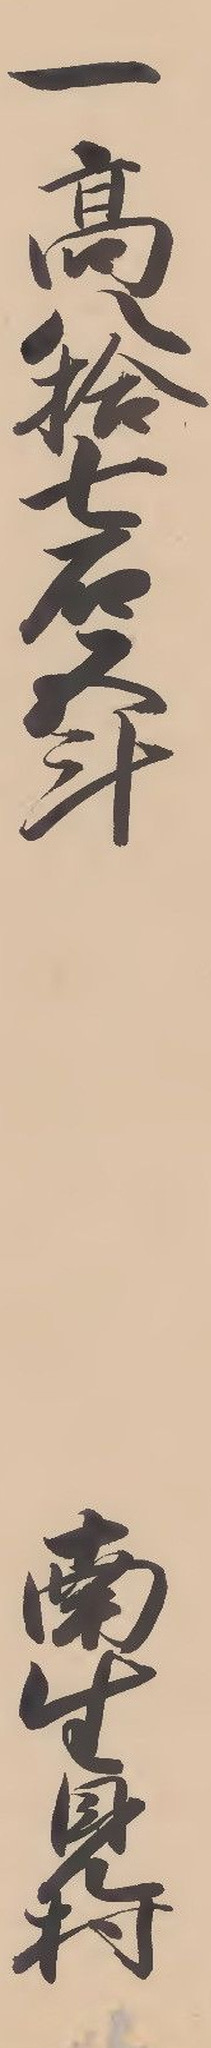一高八拾七石五斗南生見村
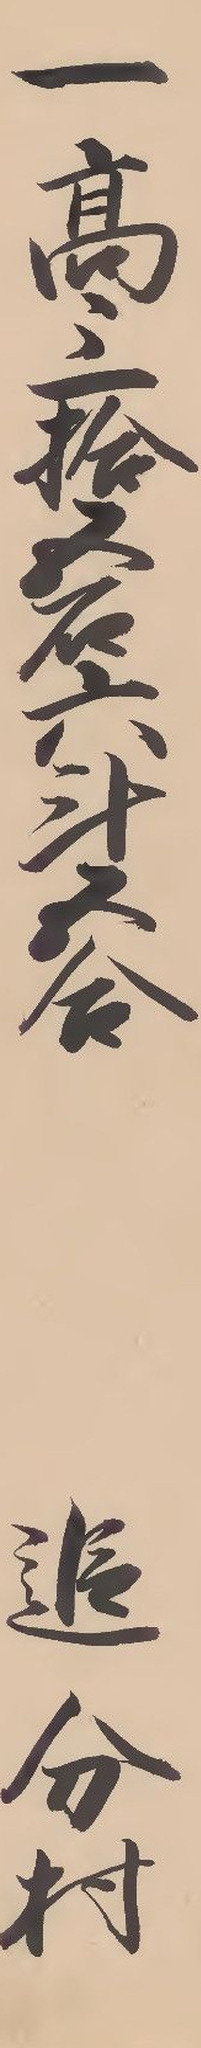一高三拾五石六斗五合追分村

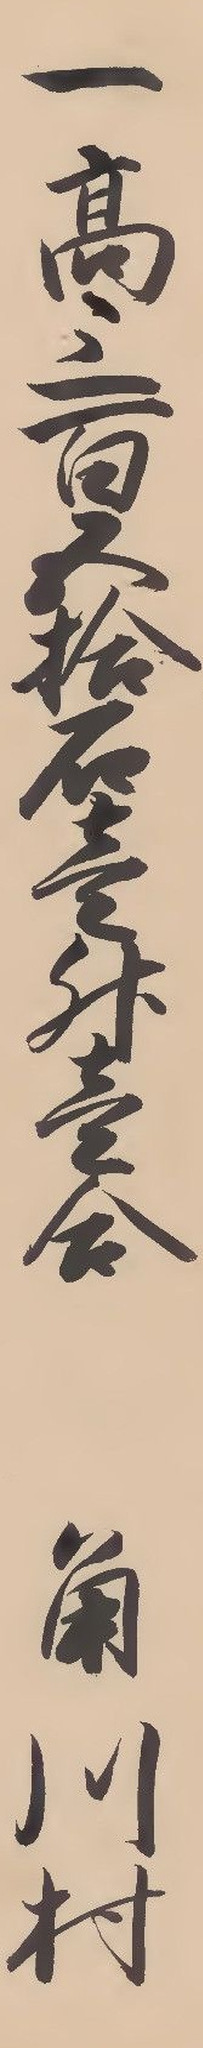一高三百五拾石壱升壱合角川村
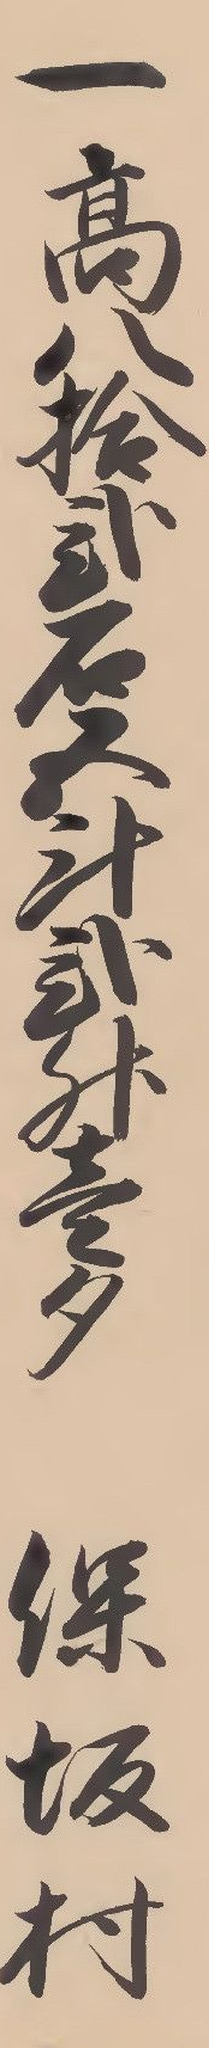一高八拾弐石五斗弐升壱勺保坂村
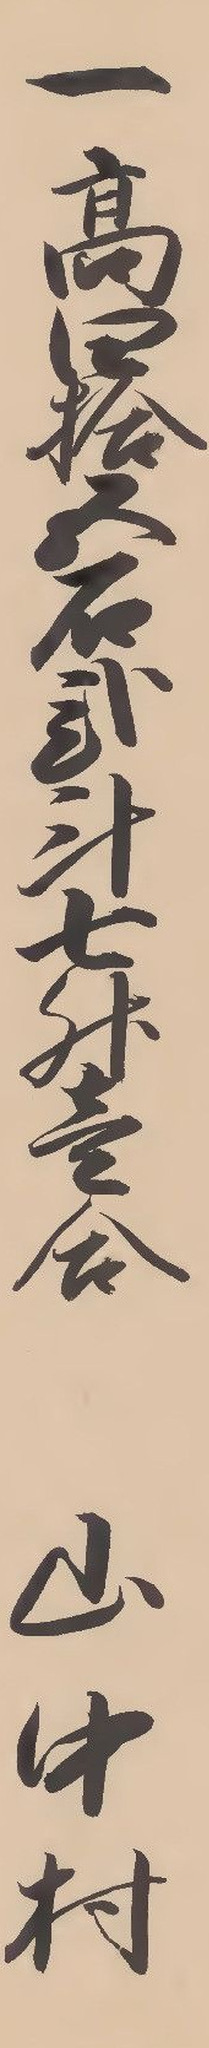一高四拾五石弐斗七升壱合山中村
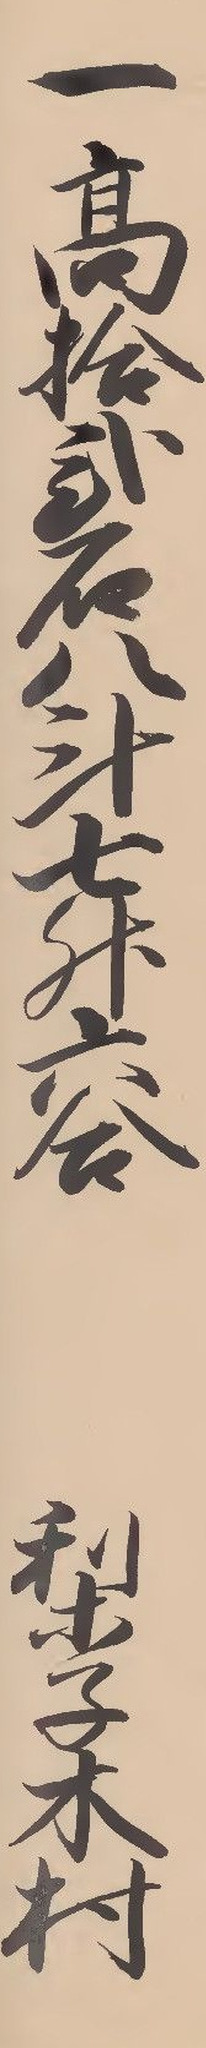一高拾弐石八斗七升六合梨子木村
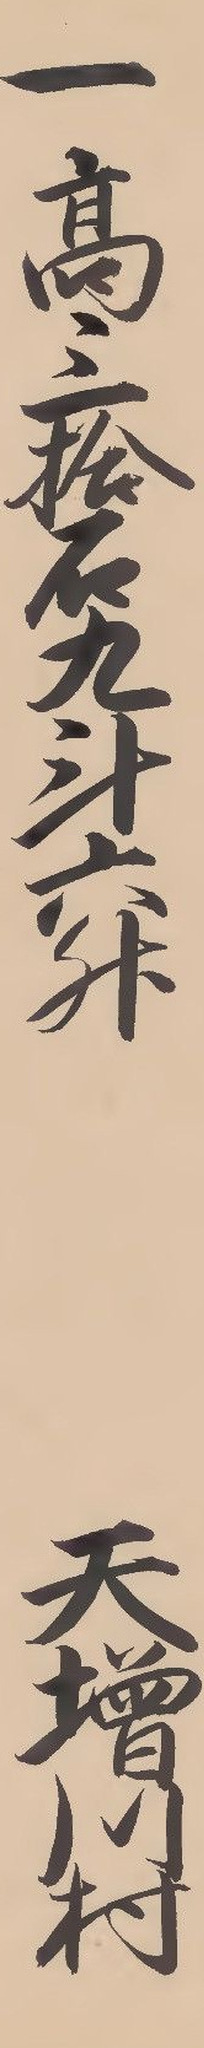一高三拾石九斗六升天増川村
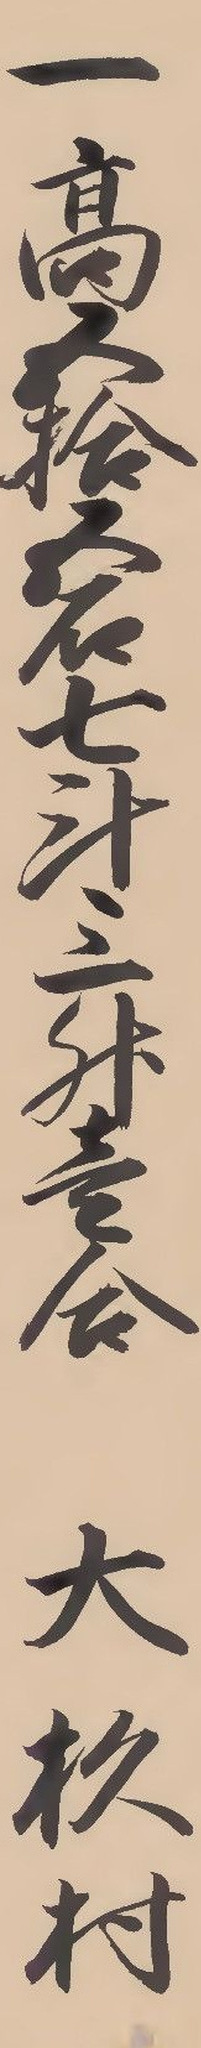一高五拾五石七斗三升壱合大杉村
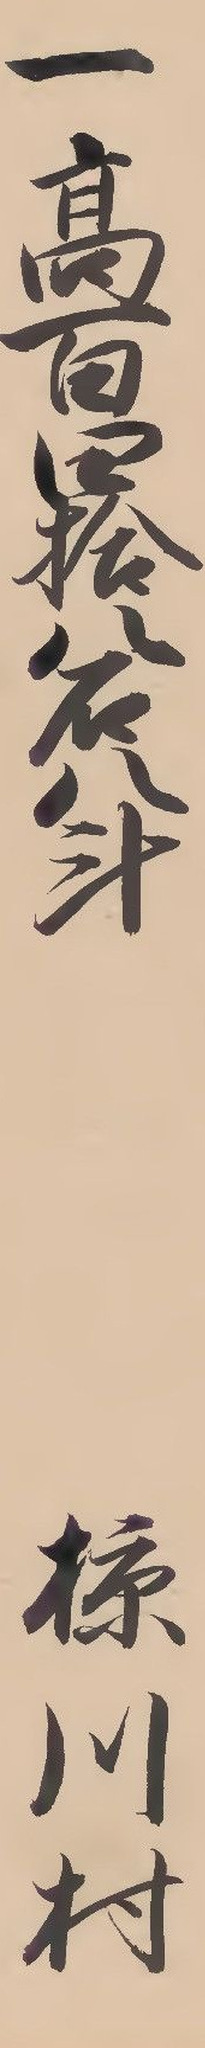一高百四拾八石八斗椋川村

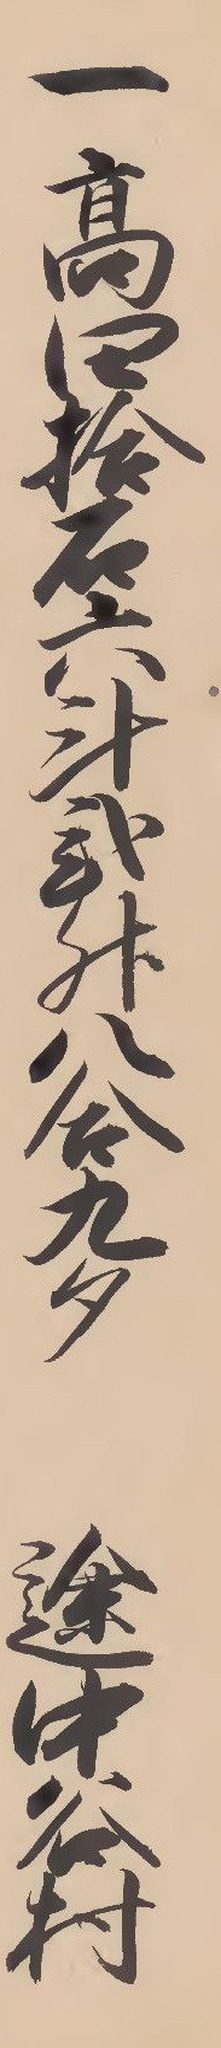一高四拾石六斗弐升八合九勺途中谷村
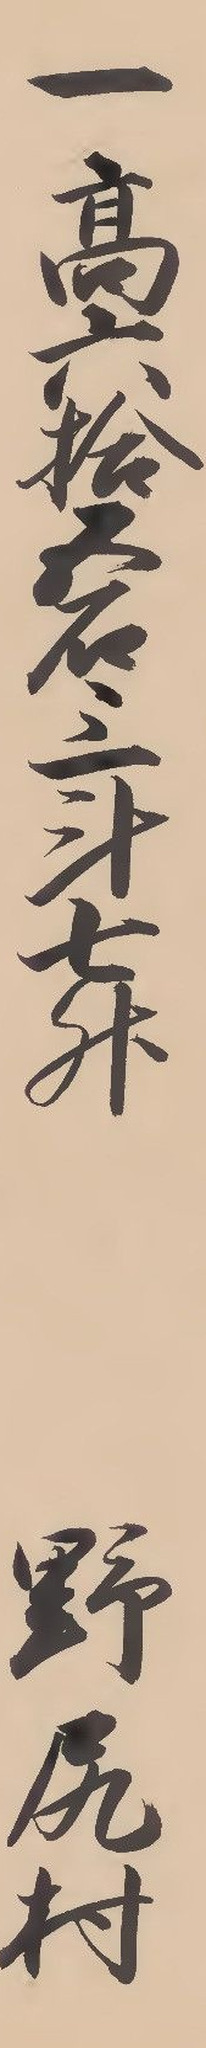一高六拾五石三斗七升野尻村
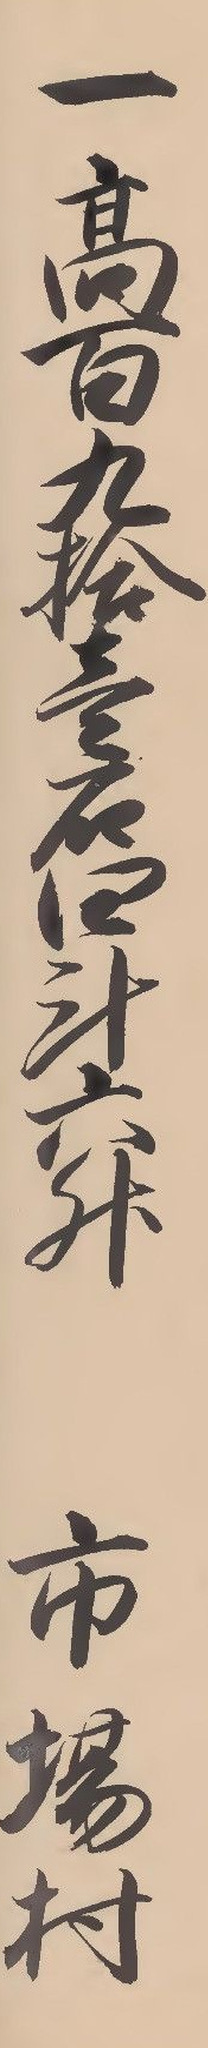一高百九拾壱石四斗六升市場村
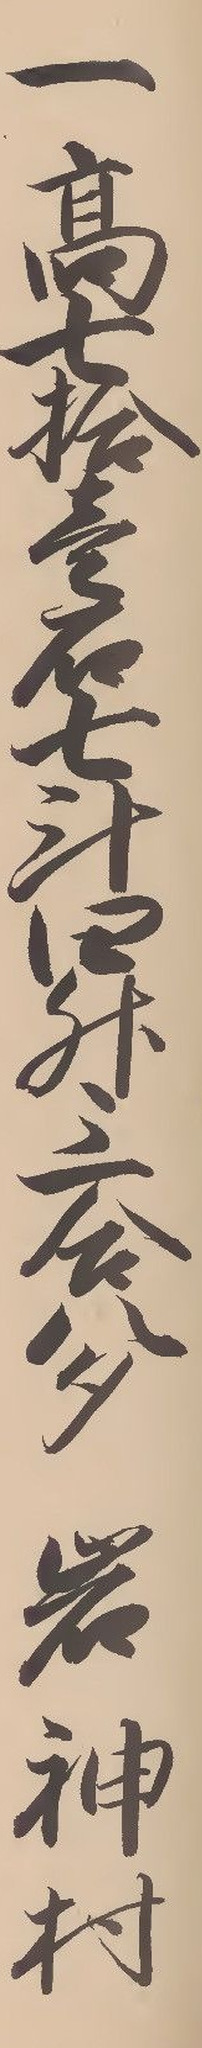一高七拾壱石七斗四升三合八勺岩神村
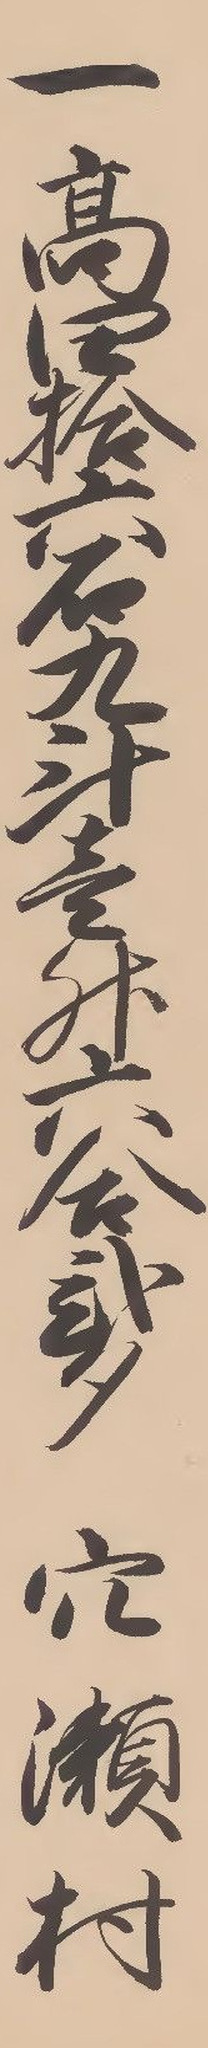一高四拾六石九斗壱升六合弐勺穴瀬村
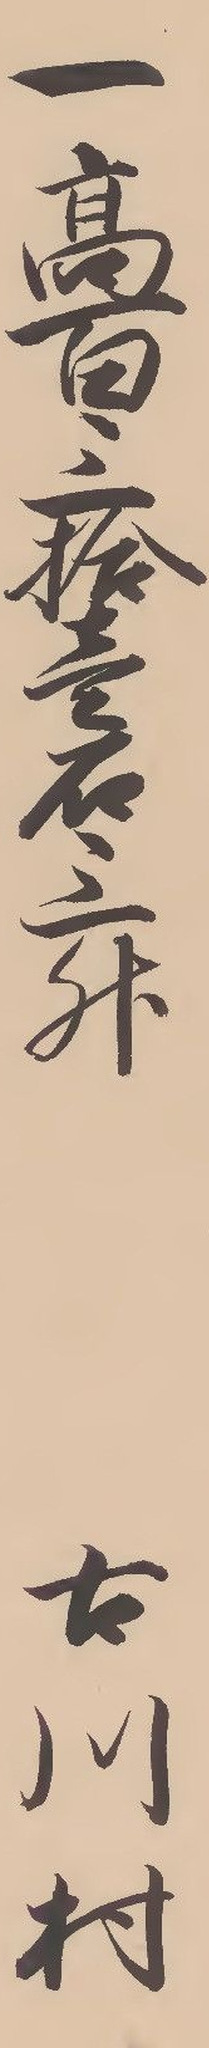一高百三拾壱石三升古川村
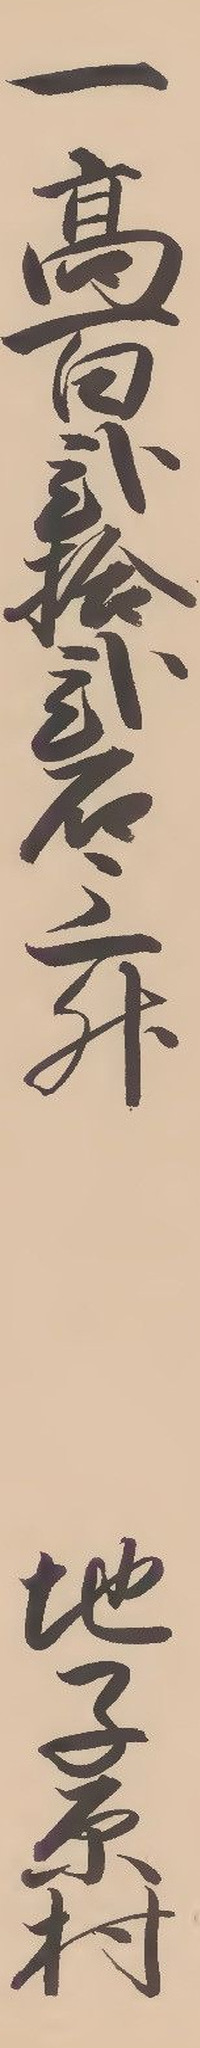一高百弐拾弐石三升地子原村
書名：近江国郷帳
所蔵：国立公文書館 National Archives of Japan
